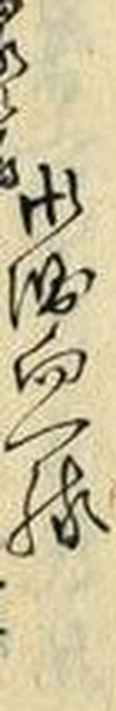御側向頭取
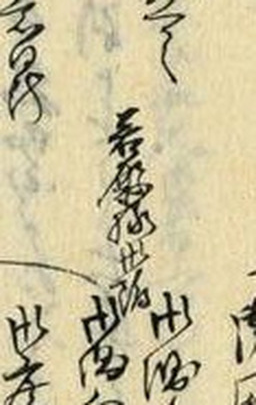若殿様御附
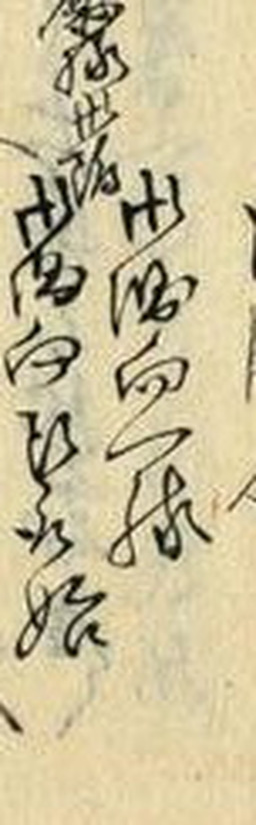御側向頭取始
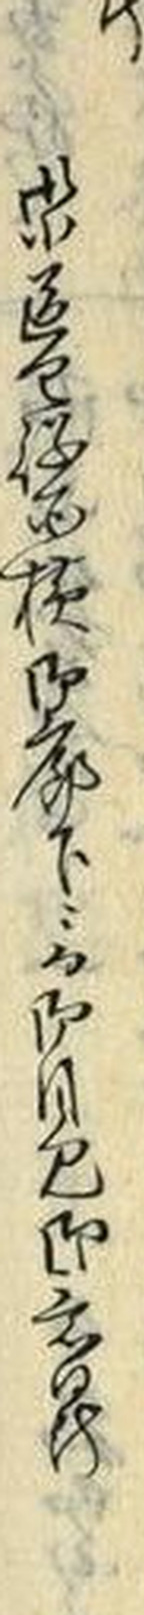御小道具役所横御廊下ニ而御目見御意同断
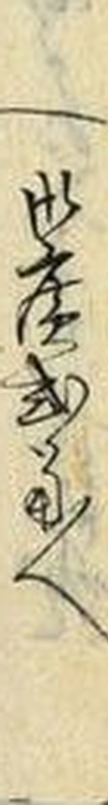御広式御用人
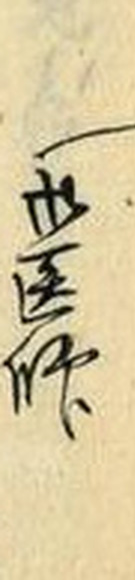御医師
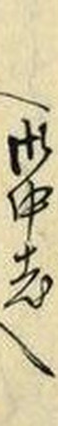御中老
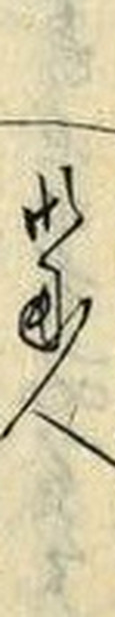御用人
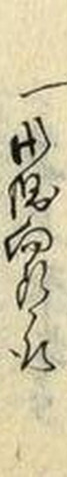御側向頭取
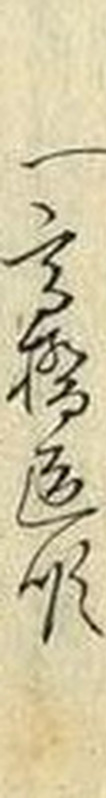高橋道順
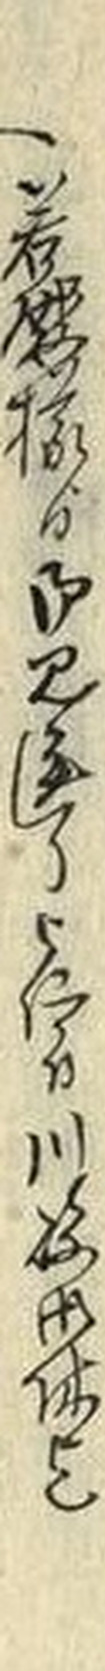若殿様ゟ御見送り被仰付川崎御休迄
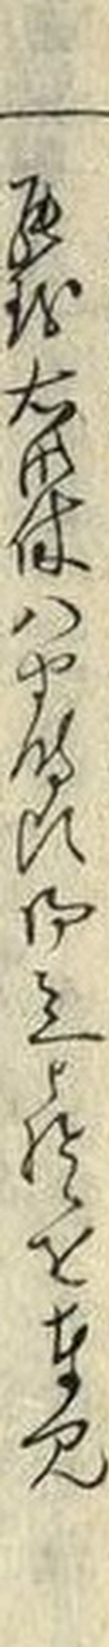罷越右御休八半時頃御立被遊候を奉見大藤助蔵
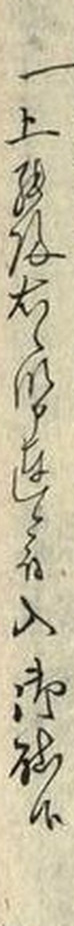上罷帰右之段申達候ニ付入御聴候
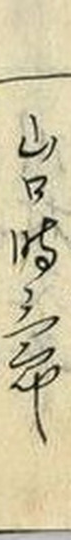山口時三郎
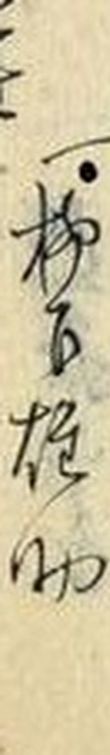栁下雄助

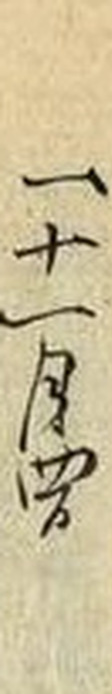一十一月四日
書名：少傅日録抄（斉承付側向頭取日記、在府）
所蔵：福井県文書館 Fukui Prefectural Archives
